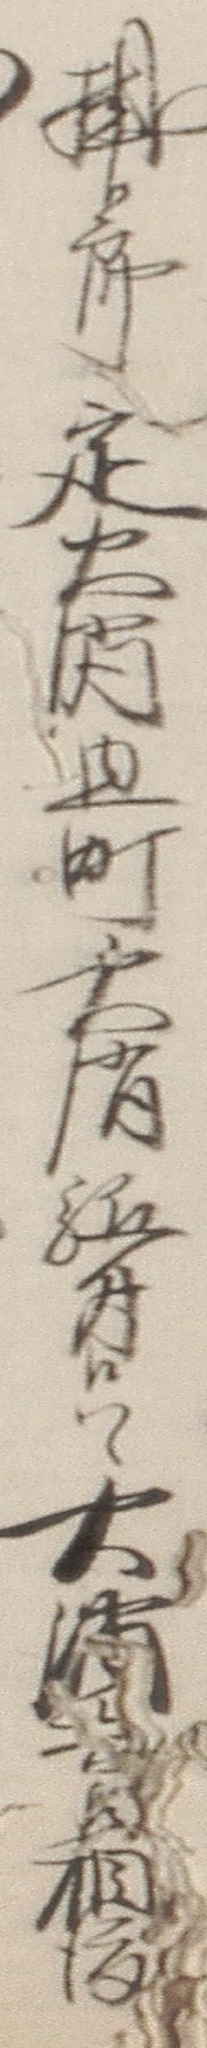掛候節定火消且町火消駆付候ハヽ火消相渡
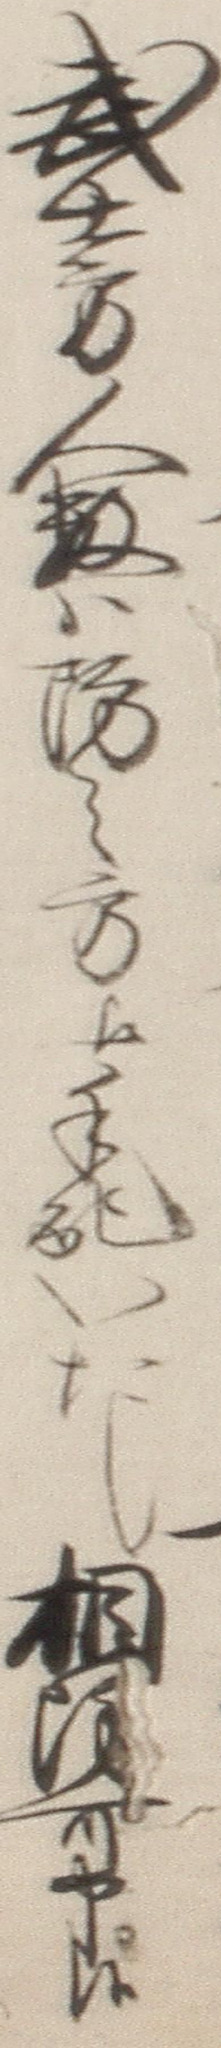武士方人数ハ防之方え手配いたし相防可申候
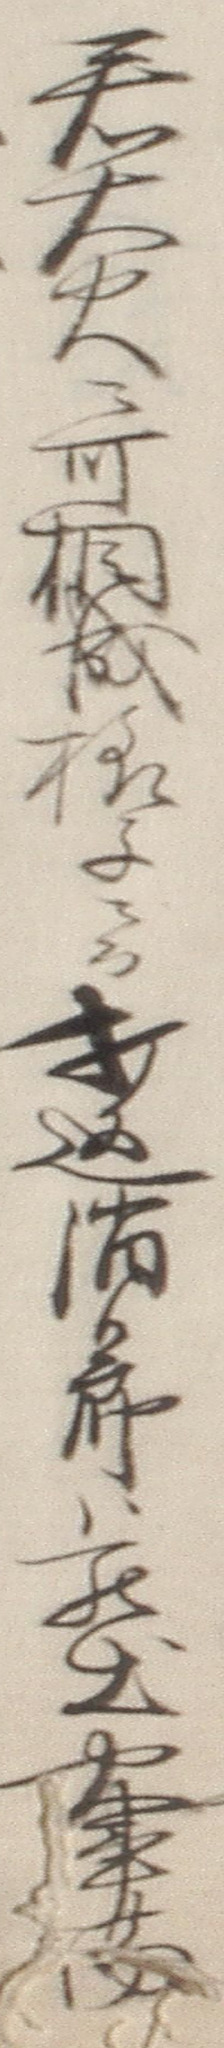若大火ニ可相成様子ニ而打込消候節ハ罷出火事場
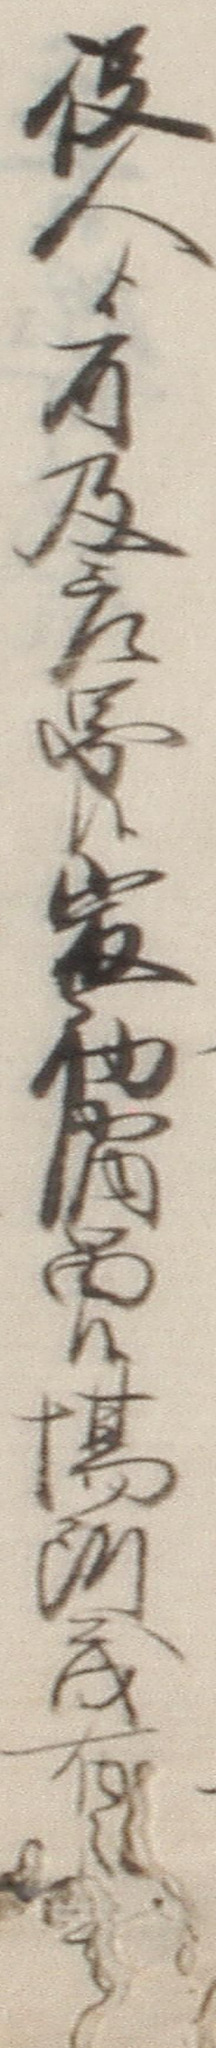役人ゟ可及差図候最初消留候場所も有之
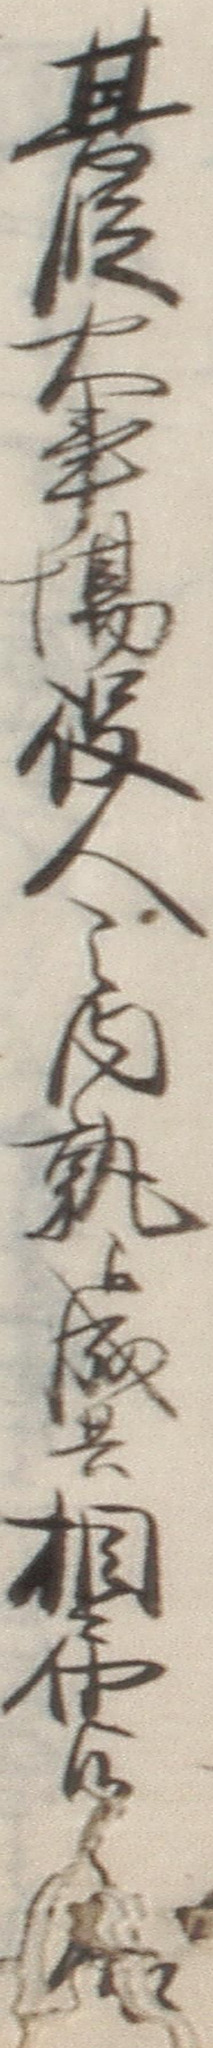其段火事場役人の内執え成共相届候
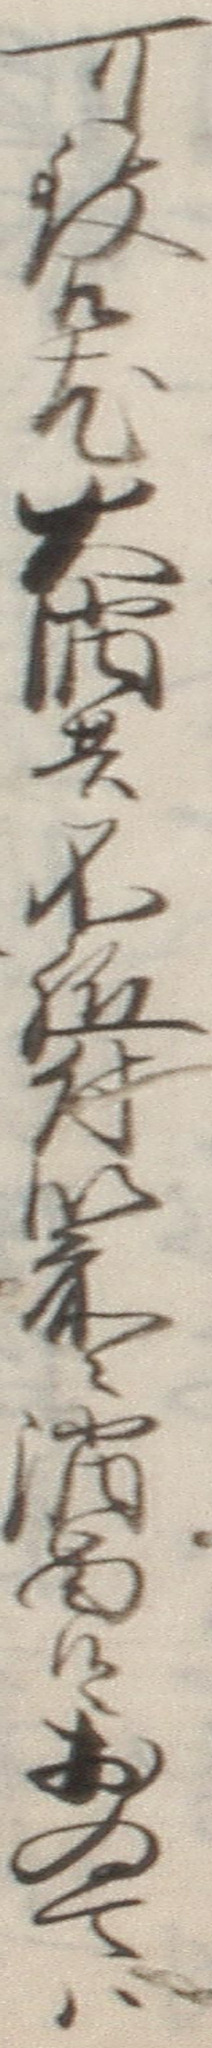可致候尤火消共不駆付以前の消留候ニおゐてハ
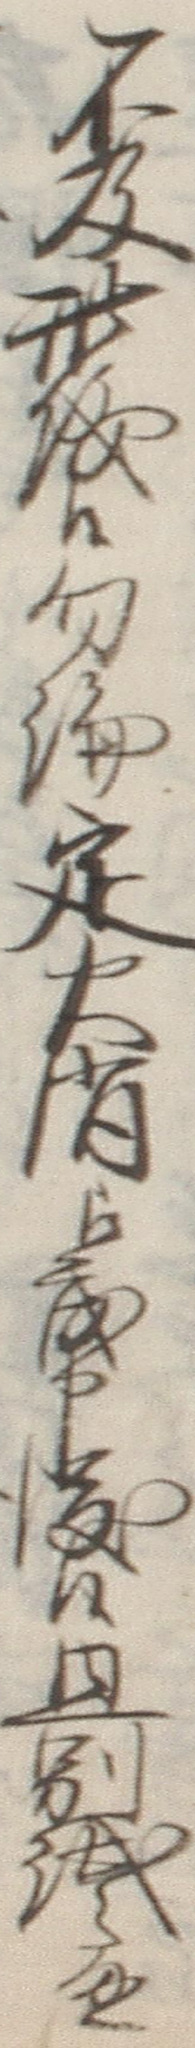不及此儀候勿論定火消えも申渡候且別紙之通
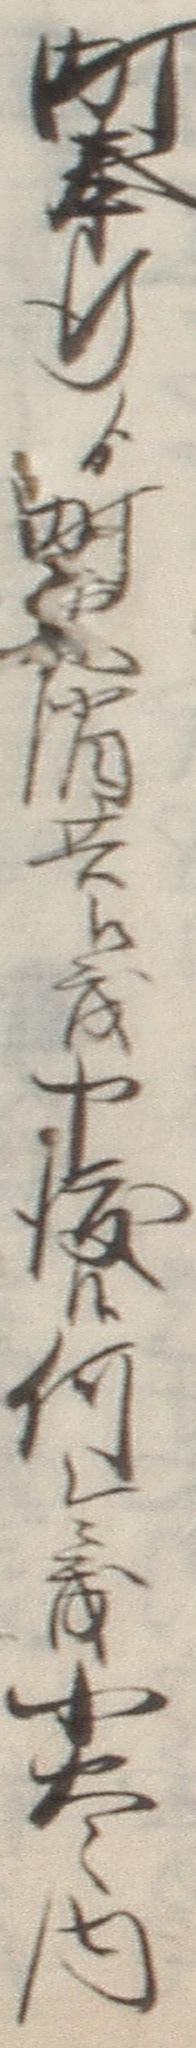町奉行ゟ町火消共えも申渡候何レニも小火の内
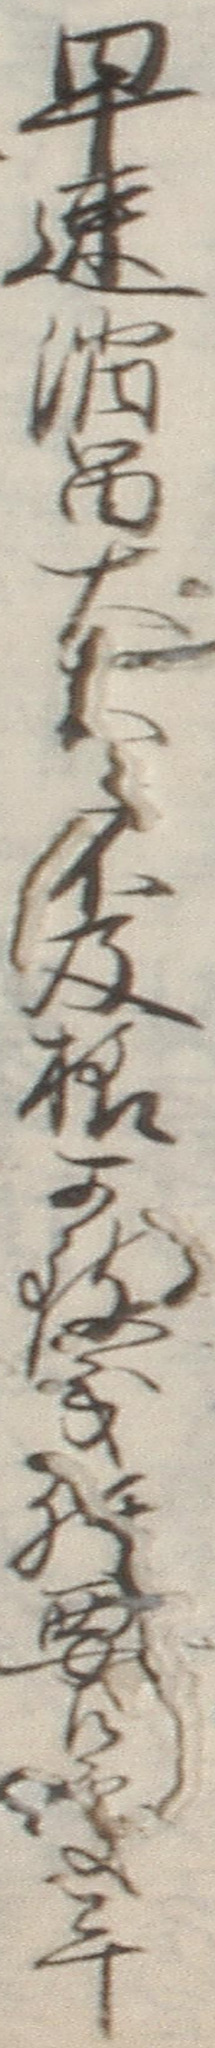早速消留大火ニ不及様可致義肝要候処畢
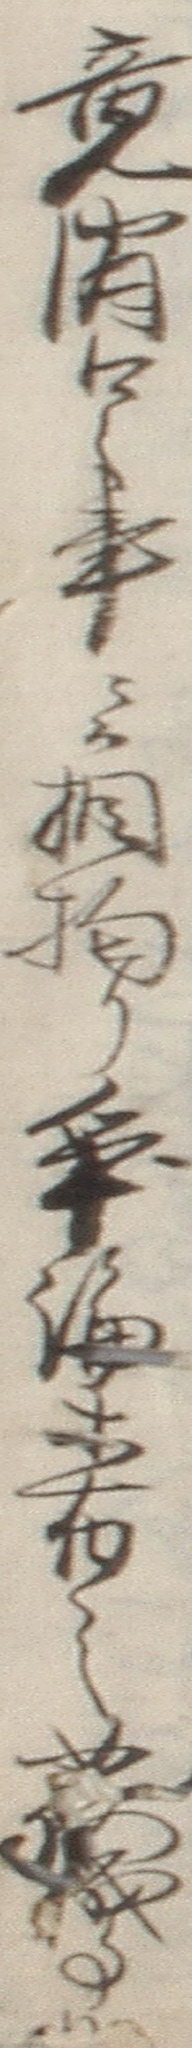竟消口の事ニ而相拘り争論等有之如何成事

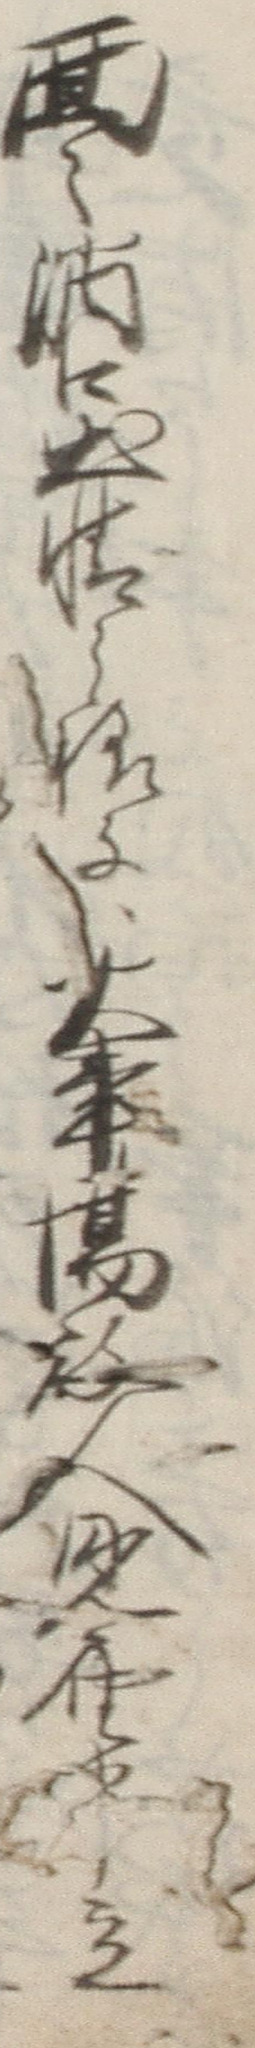面々消口出情の様子ハ火事場役人見届申立
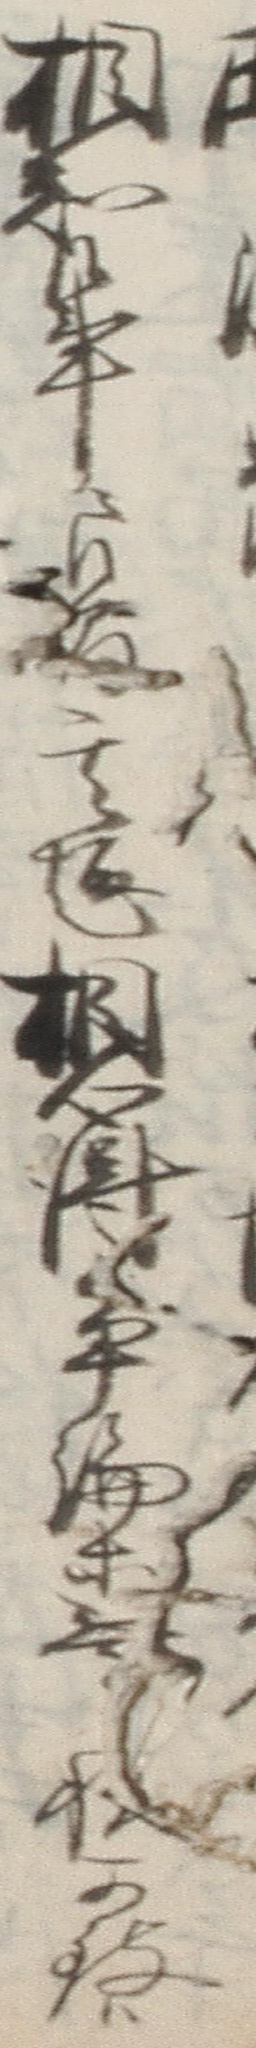相知候事ニ候而其趣相心得争論等無之様可致候
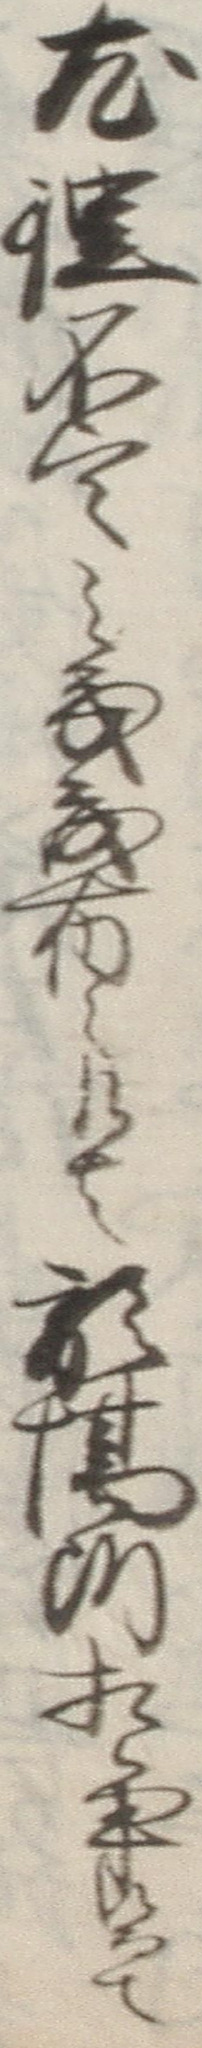尤鋰不尽の義茂有之候者於場所相争候而者
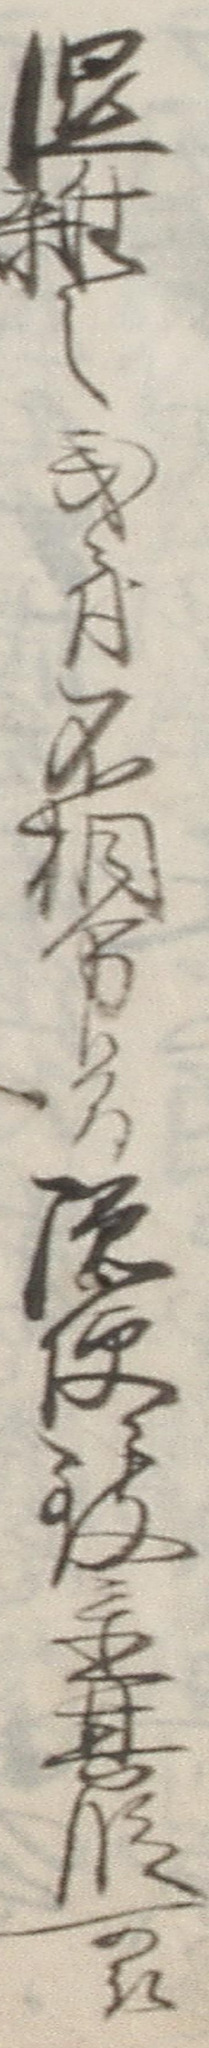混雑之義ニ付不相分候間穏便ニ致置其段可被
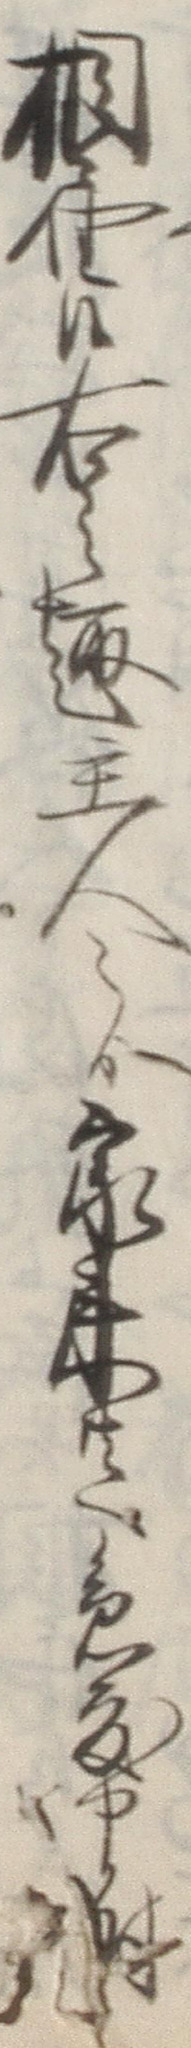相届候右之趣主人々ゟ家来共へ急度申附
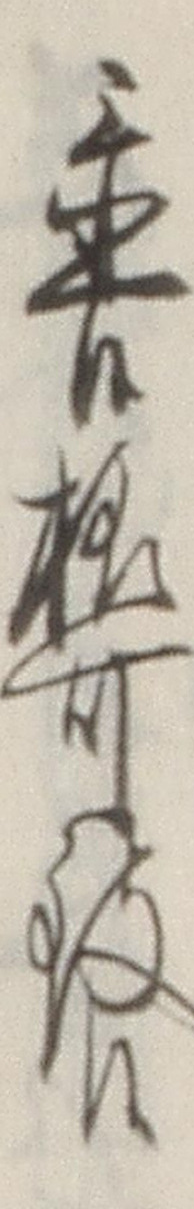置候様可致候
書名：[諸国災害記録]
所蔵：東京大学地震研究所図書室 Earthquake Research Institute Library, The University of Tokyo, JAPAN
